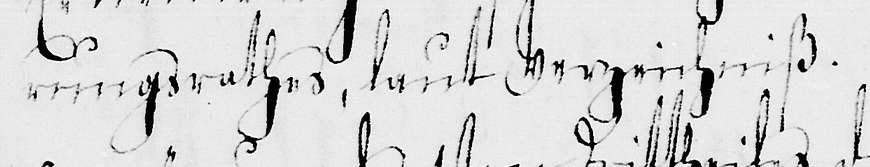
rungsrathes, laut Verzeichniß.
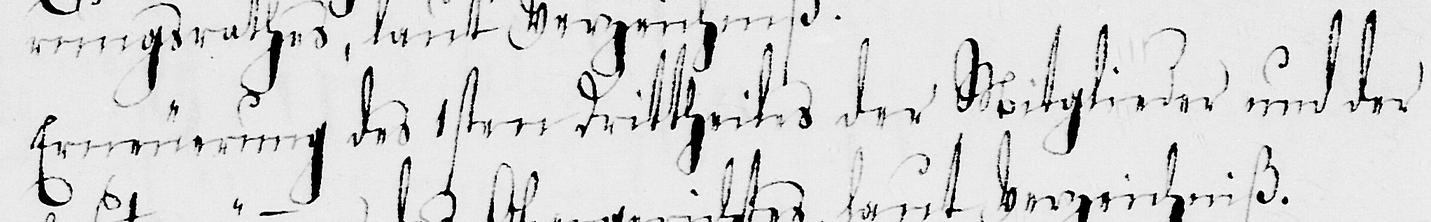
Erneuerung des 1sten Drittheils der Mitglieder und der
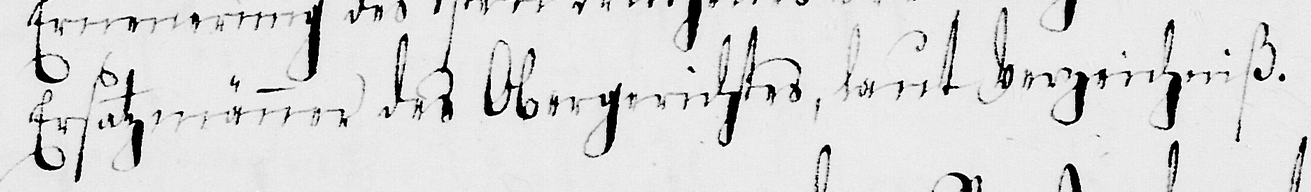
Ersatzmänner des Obergerichtes, laut Verzeichniß.
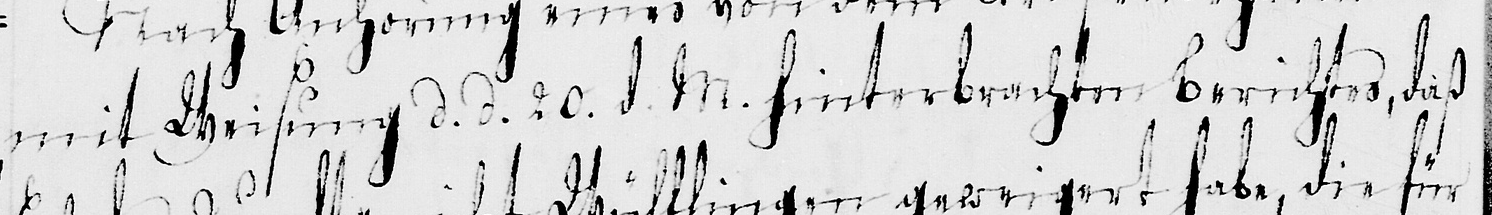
mit Weisung d. d. 20. d. M. hinterbrachten Berichtes, daß
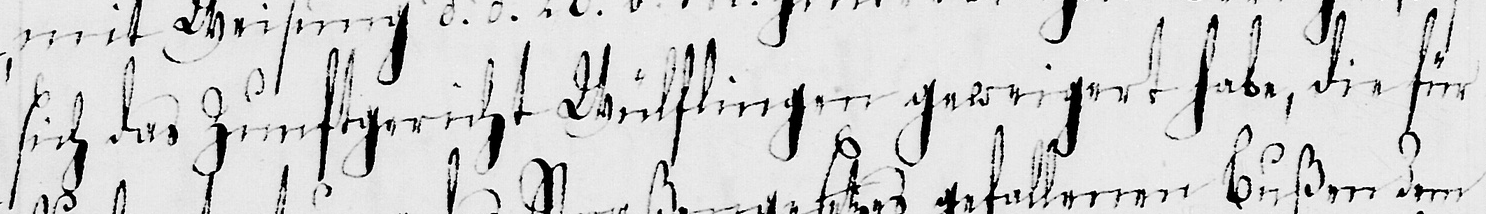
sich das Zunftgericht Wülflingen geweigert habe, die für
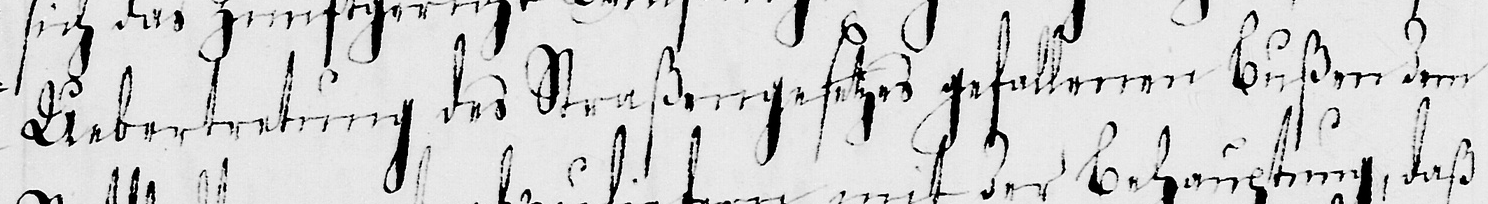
Uebertretung des Straßengesetzes gefallenen Bußen dem
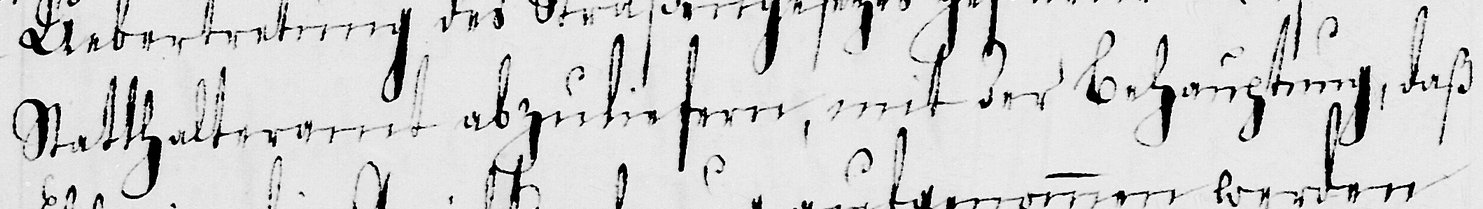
Statthalteramt abzuliefern, mit der Behauptung, daß
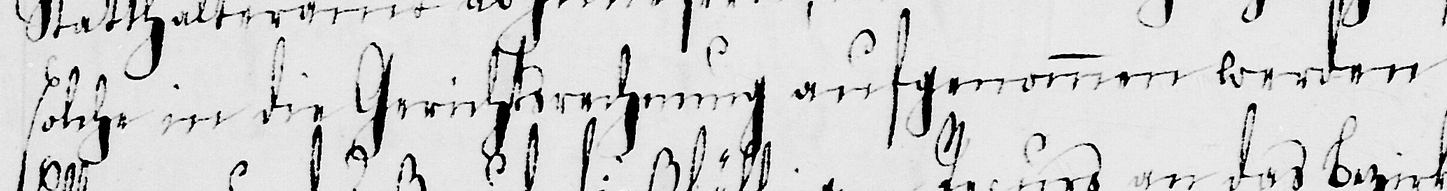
solche in die Gerichtsrechnung aufgenommen werden
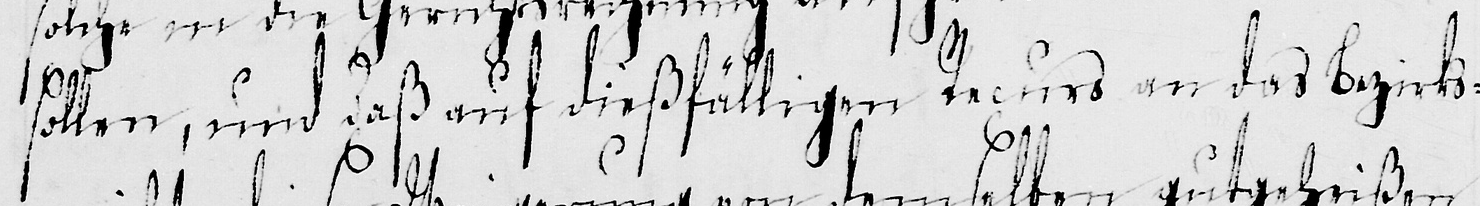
sollen, und daß auf dießfälligen Recurs an das Bezirks¬
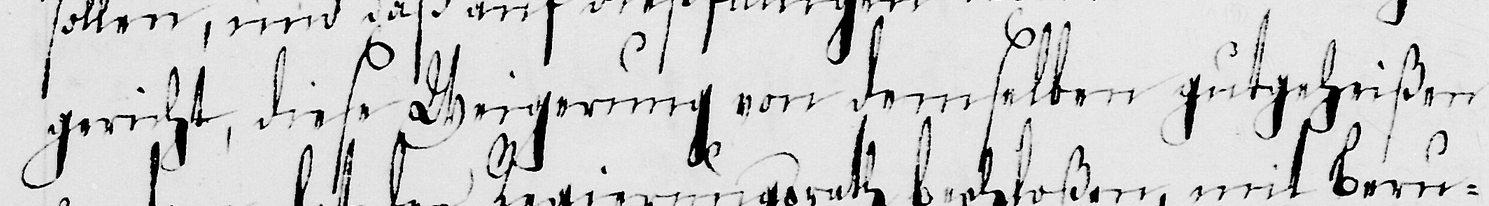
gericht, diese Weigerung von demselben gutgeheißen
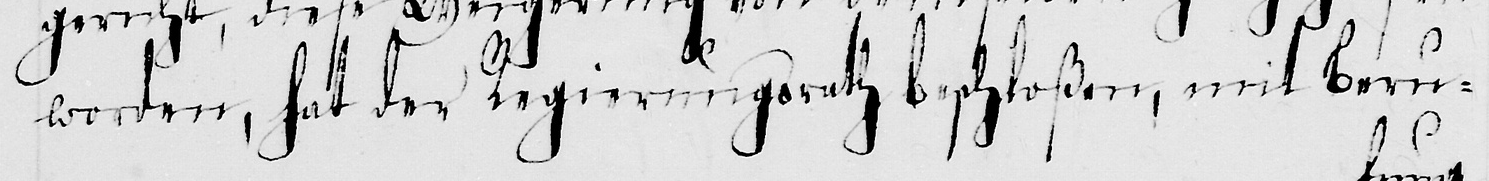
worden, hat der Regierungsrath beschloßen, mit Beru-
